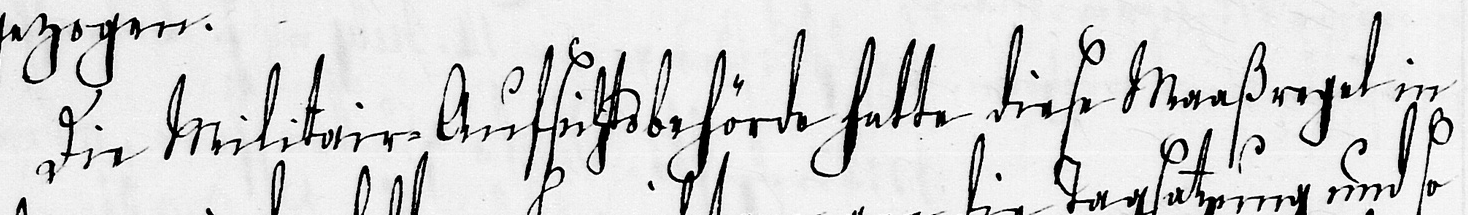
Die Militair-Aufsichtsbehörde hatte diese Maaßregel in
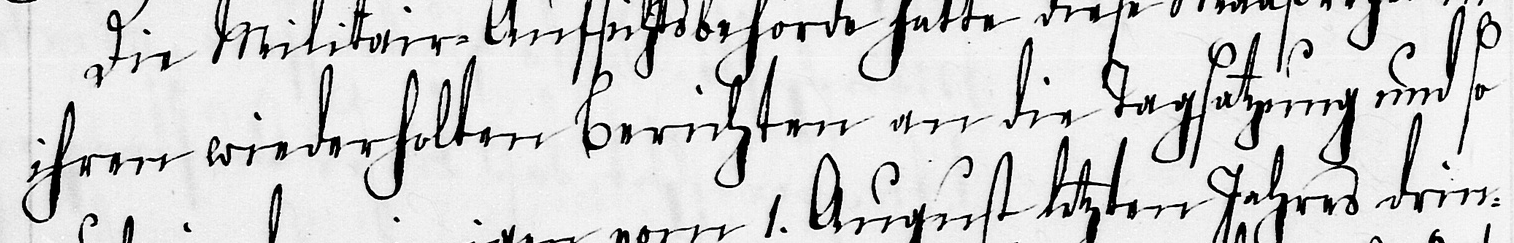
ihren wiederholten Berichten an die Tagsatzung und so
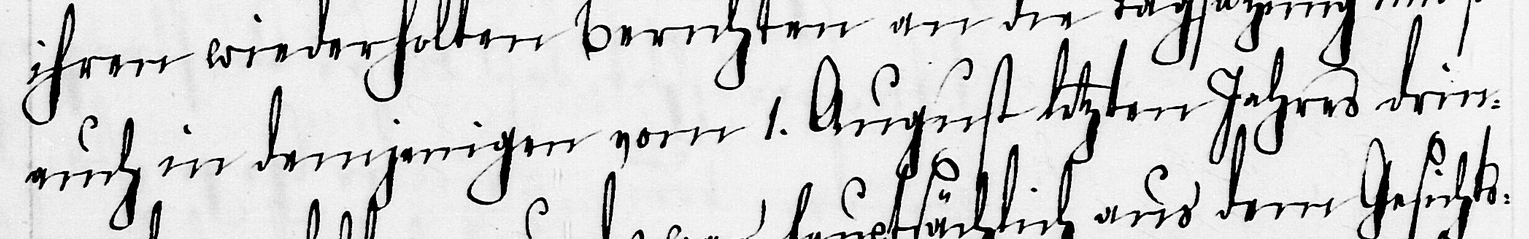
auch in demjenigen vom 1. August letzten Jahres drin¬
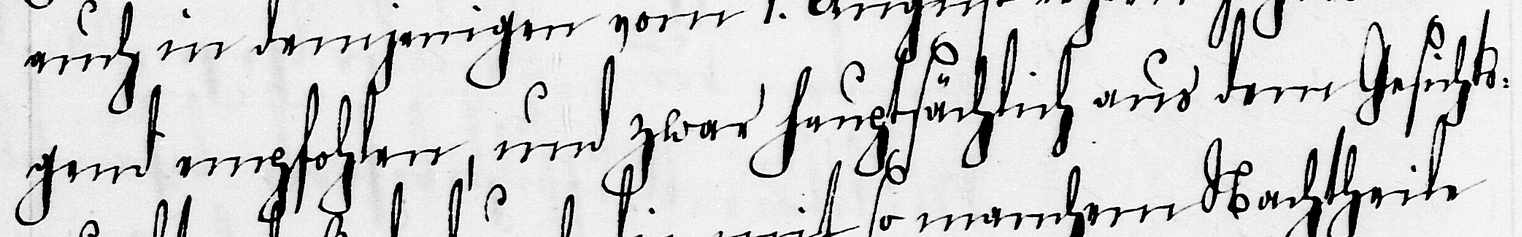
gend empfohlen, und zwar hauptsächlich aus dem Gesich¬
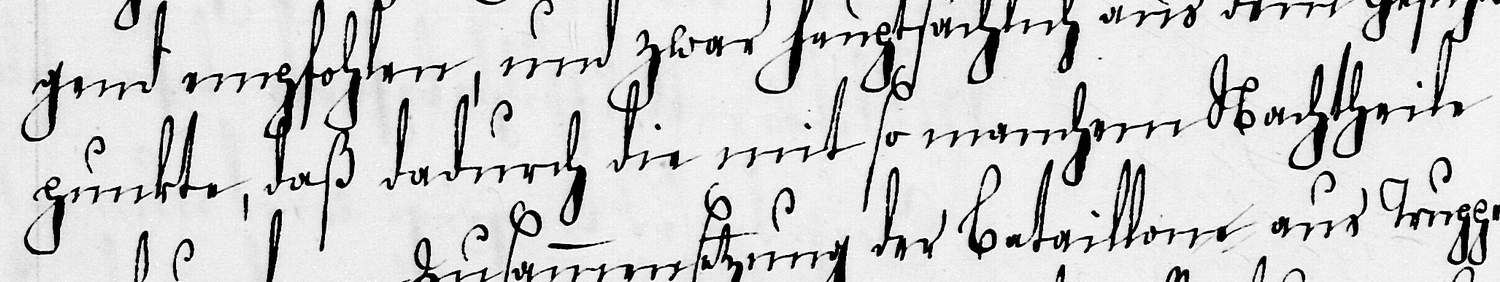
punkte, daß dadurch die mit so manchem Nachtheile
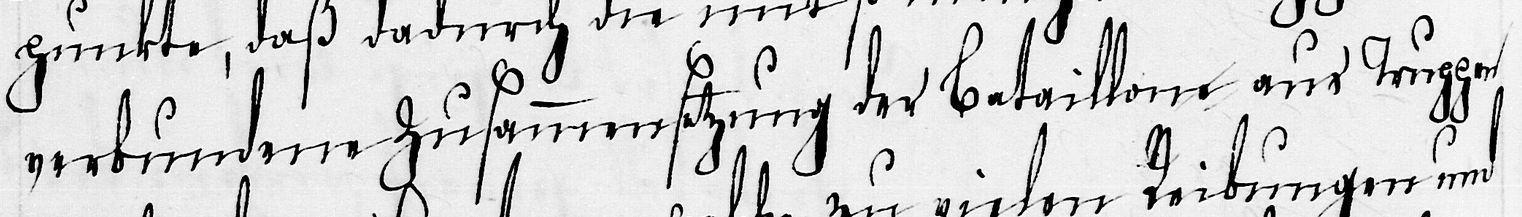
verbundene Zusammensetzung der Bataillone aus Trupp¬
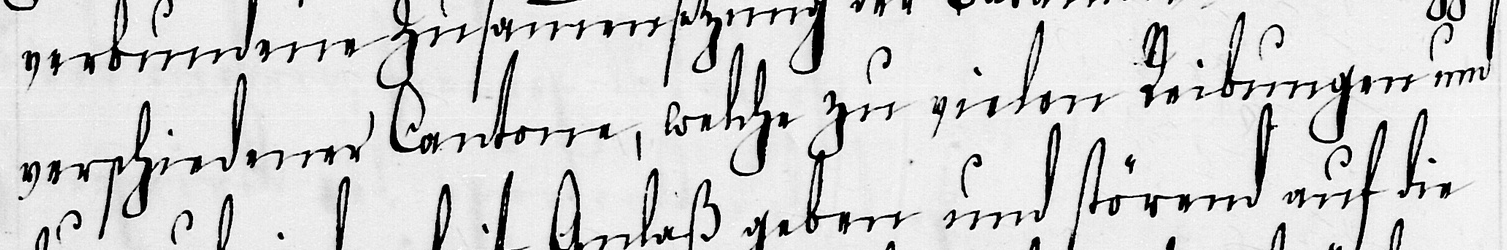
verschiedener Cantone, welche zu vielen Reibungen und
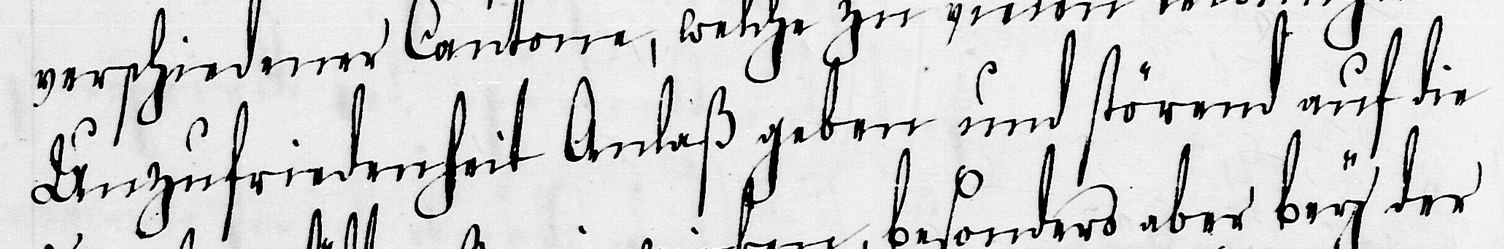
Unzufriedenheit Anlaß geben und störend auf die
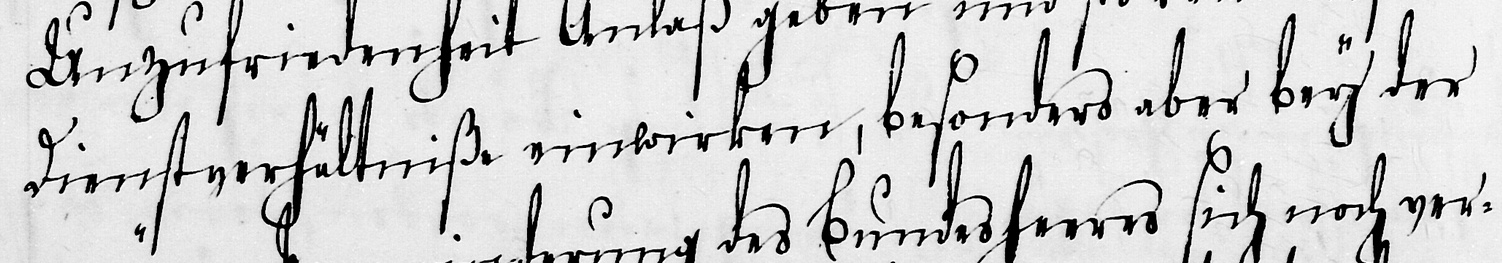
Dienstverhältniße einwirken, besonders aber bey der
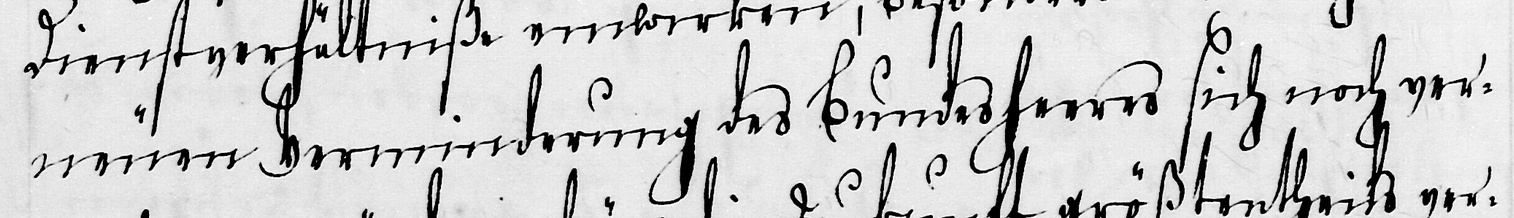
neuen Verminderung des Bundesheeres sich noch ver¬
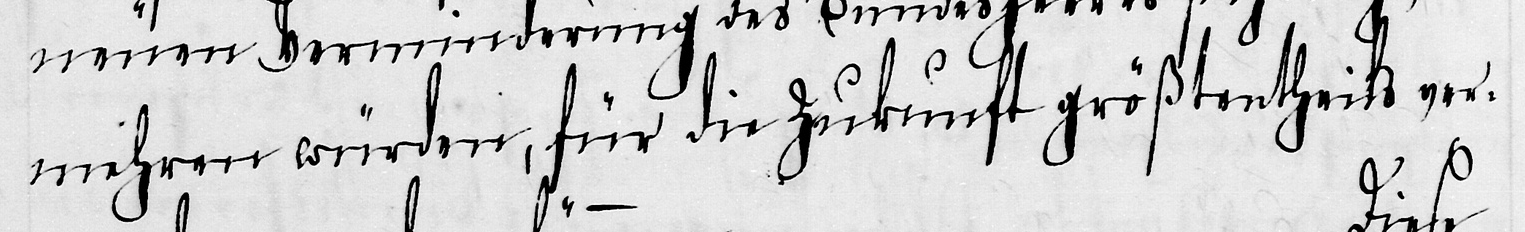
mehren würden, für die Zukunft größtentheils ver¬
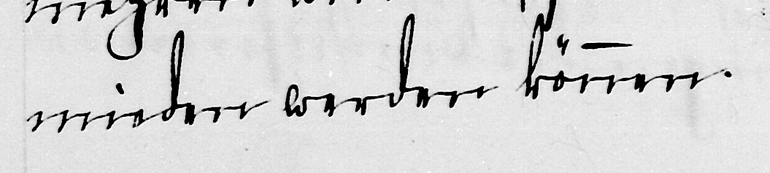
mieden werden können.
